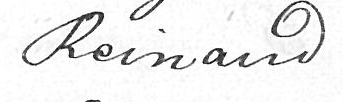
Reinaud
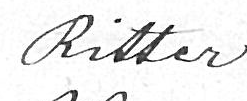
Ritter
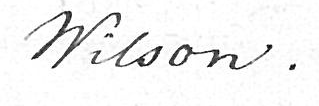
Wilson
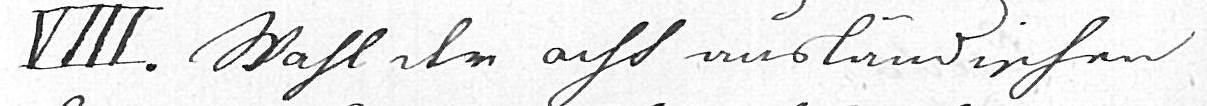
VIII. Wahl der acht ausländischen
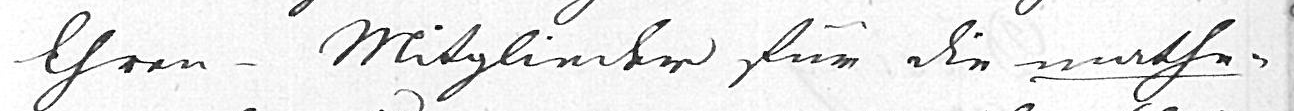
Ehren-Mitglieder für die mathe-
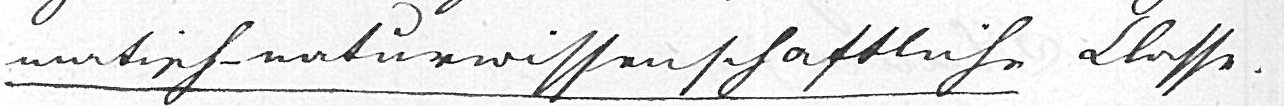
matisch-naturwissenschaftliche Class.
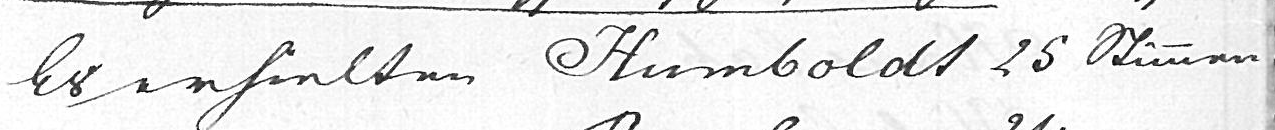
Er erhielten Humboldt 25 Stimmen
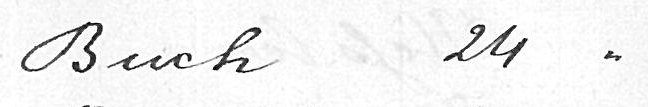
Buch 24 "
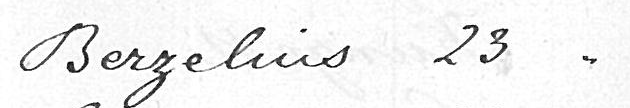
Berzelius 23 "
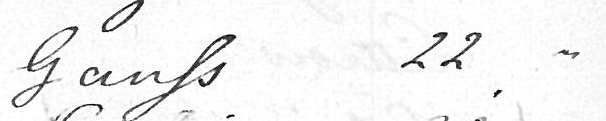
Gauss 22 "
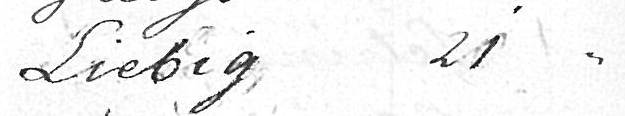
Liebig 21 "
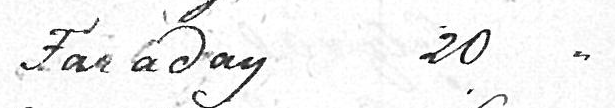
Faraday 20 "
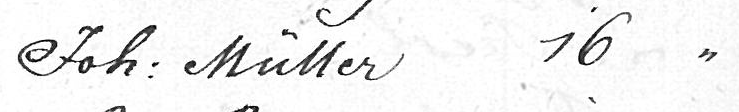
Joh: Müller 16 "
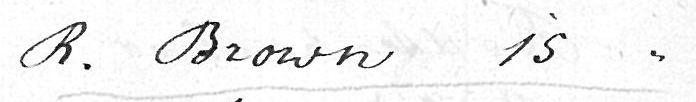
R. Brown 15 "
